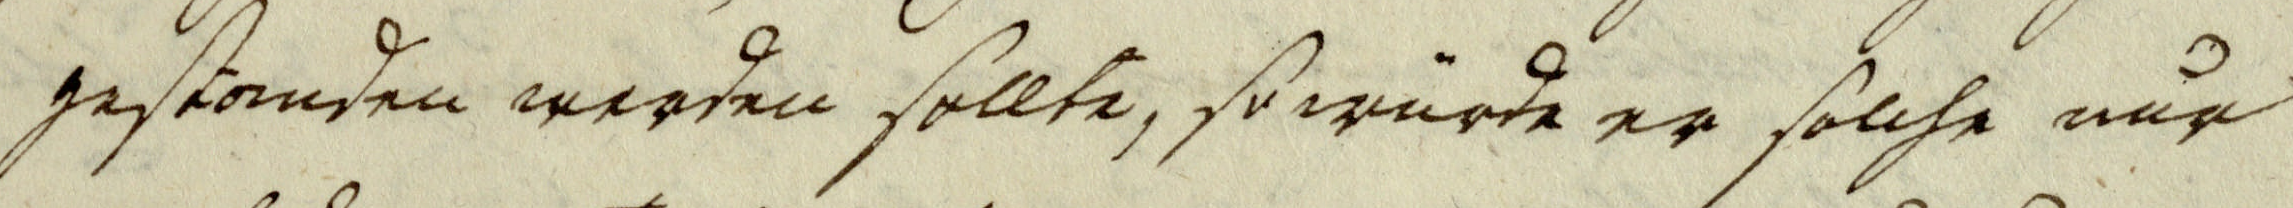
gestanden werden sollte, so würde er solche nur
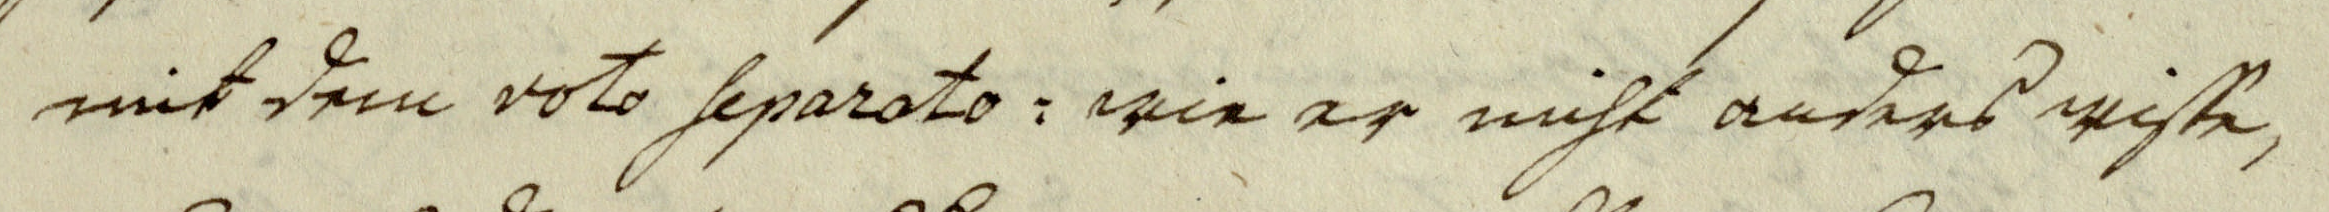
mit dem voto separato: wie er nicht anders wisse,
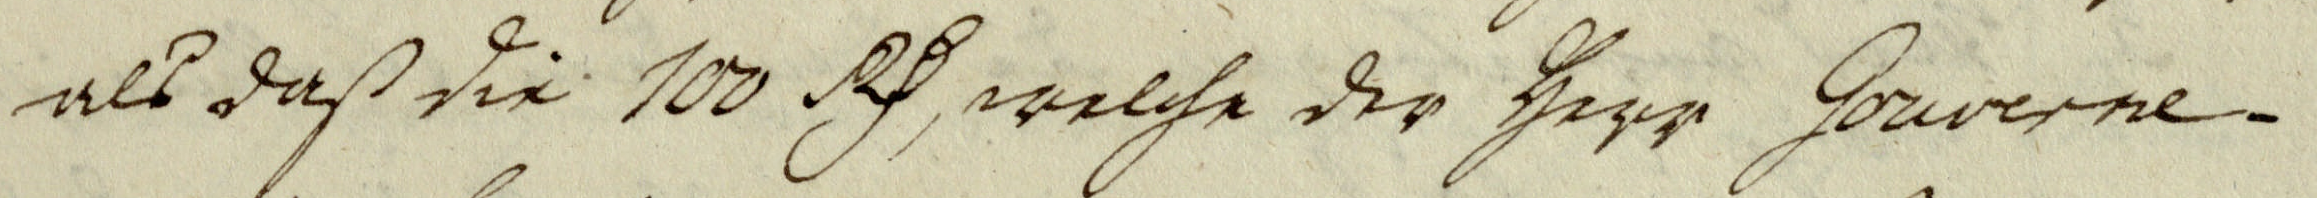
als daß die 100 rtl., welche der Herr Gouverne¬
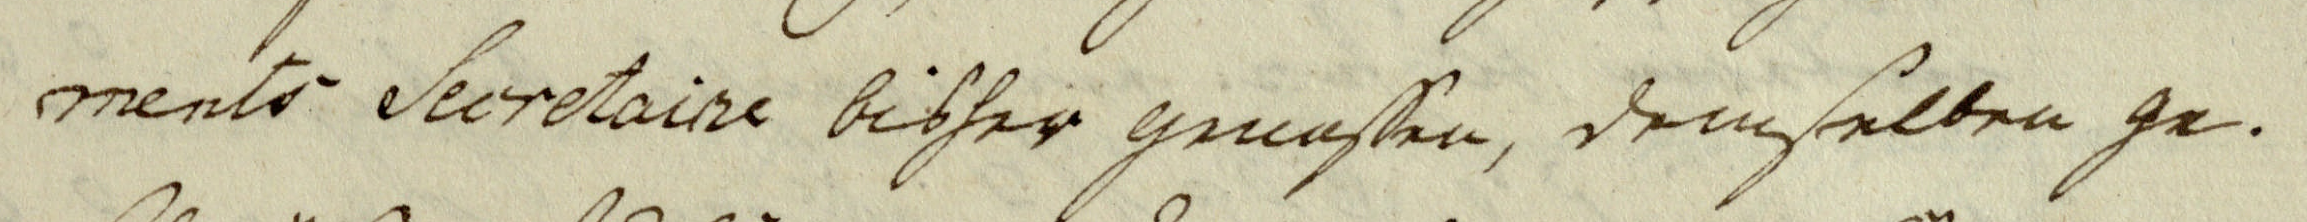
ments Secretaire bisher genossen, demselben ge¬
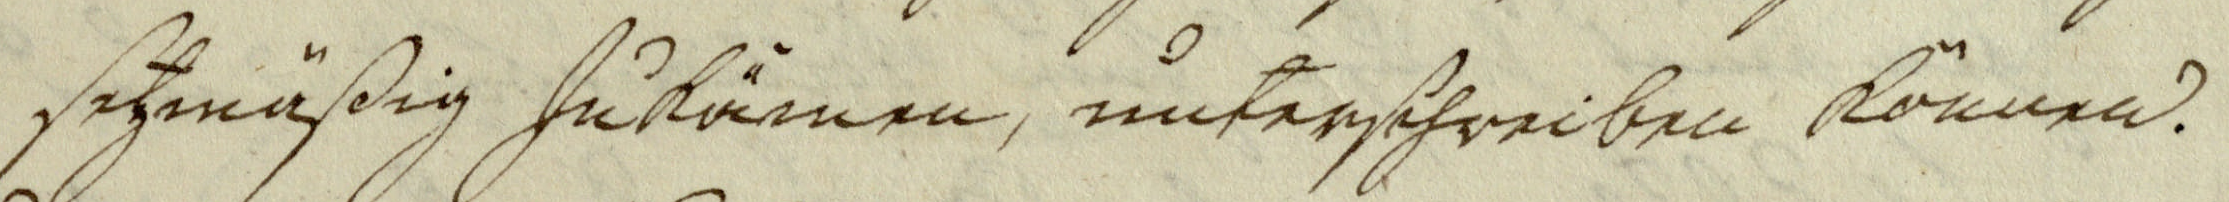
setzmäßig zukämen, unterschreiben könne?
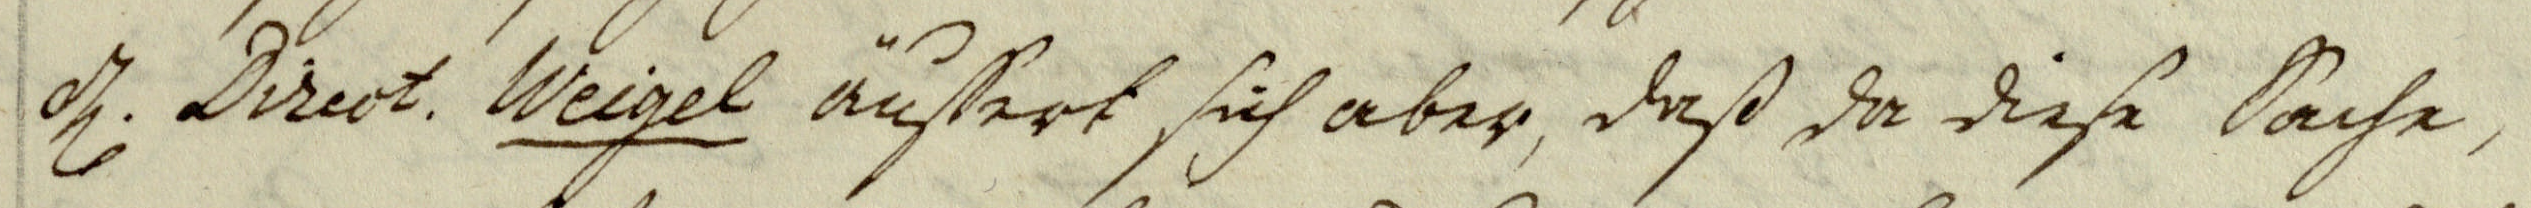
dh. Direct. Weigel äußert sich aber, daß da diese Sache,
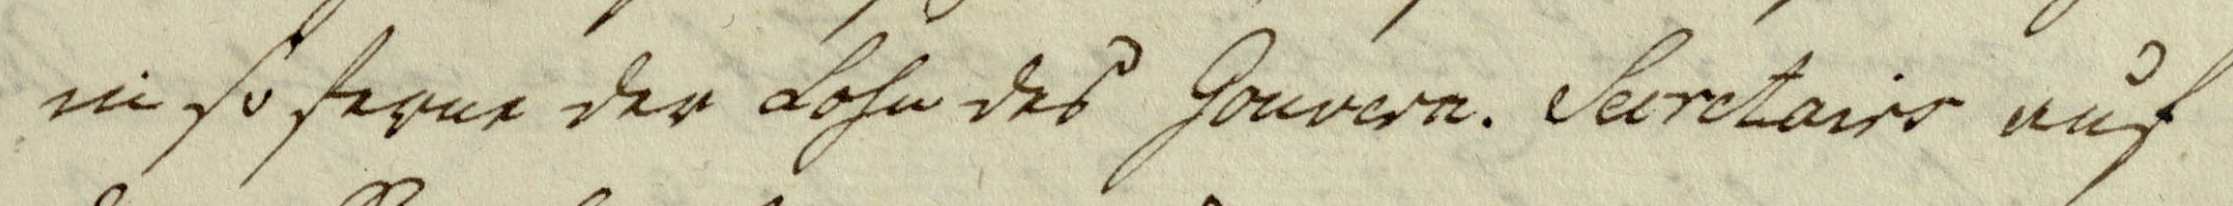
in so ferne der Lohn des Gouvern. Secretaire auf
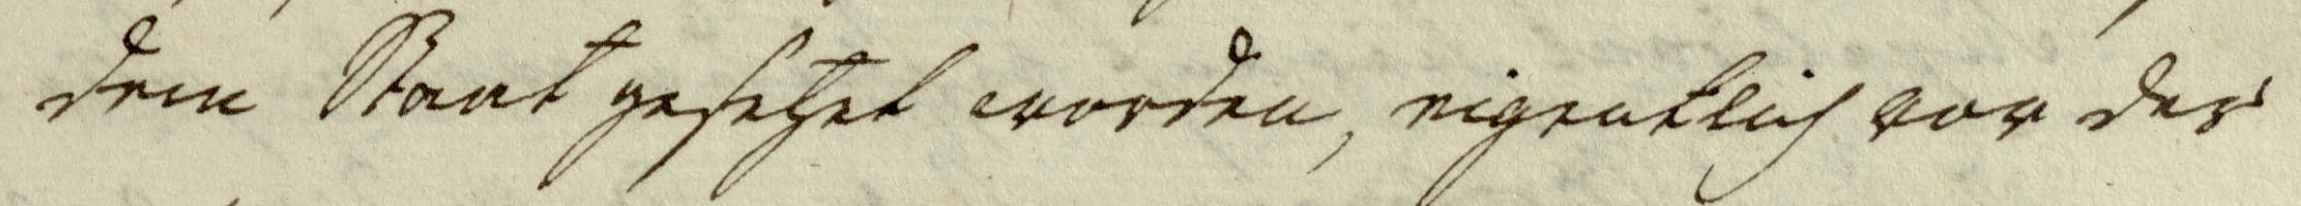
dem Staat gesetzt worden, eigentlich vor der
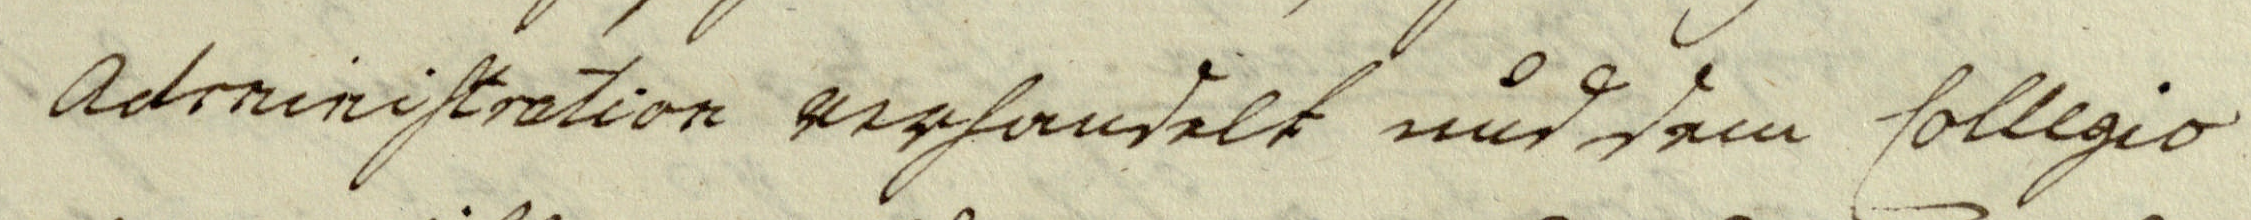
Administration verhandelt und dem Collegio
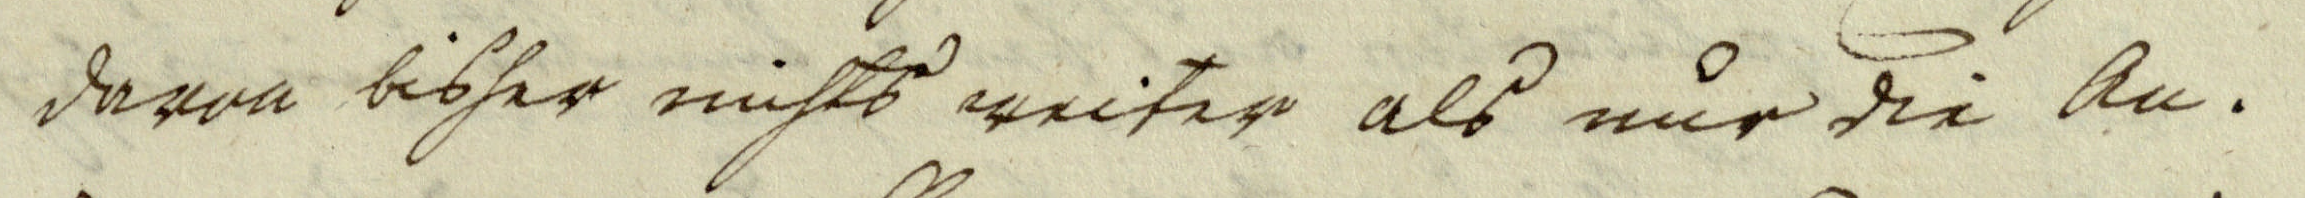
davon bisher nichts weiter als nur die An¬
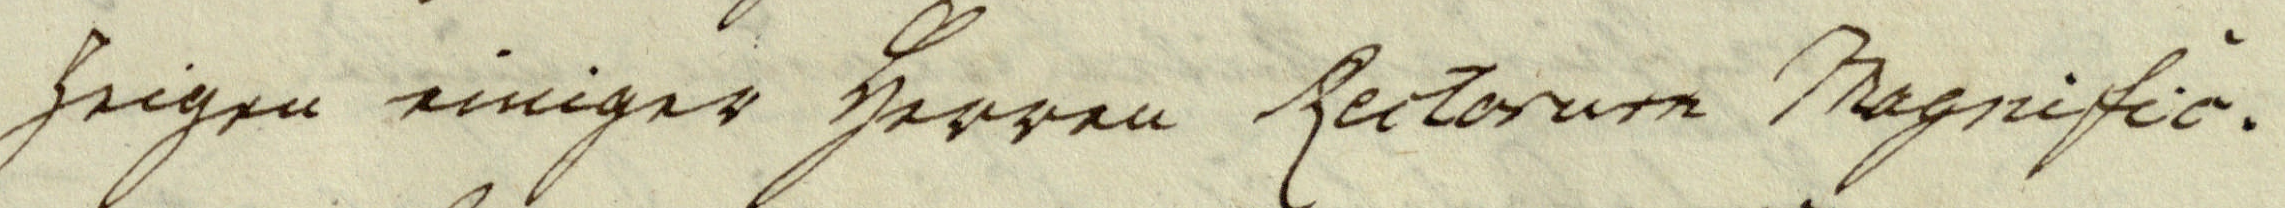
zeigen einiger Herren Rectorum Magnific.
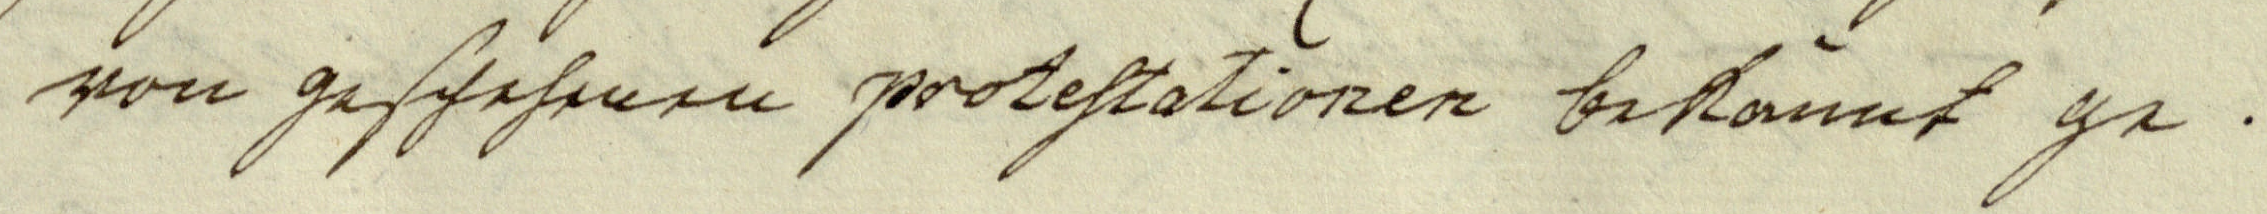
von geschehenen protestationen bekannt ge¬
